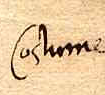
Costume
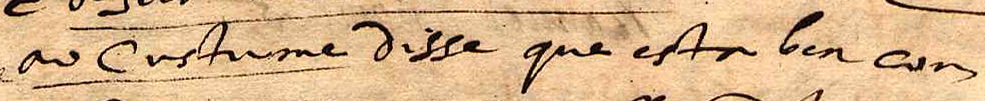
ao custume disse que esta ben com
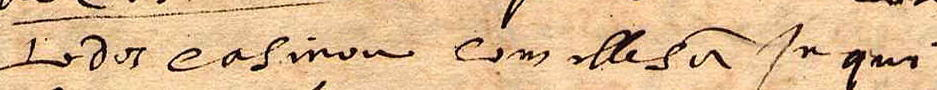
todos e asinou com elle sōr Jnqui
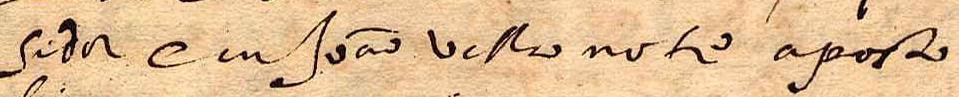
sidor e eu Joaõ velho notro aposto
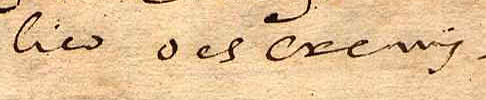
lico o escreuy
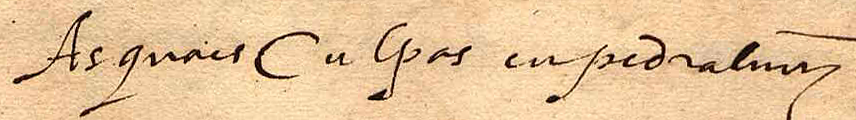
As quais Culpas eu pedralur̄ez
